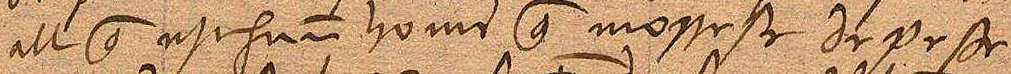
all q̄ njnhuū homē q̄ morrese de peste
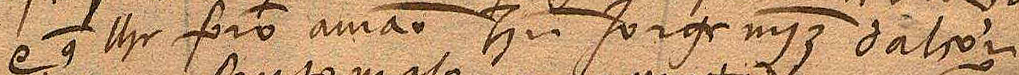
e q̄ lhe forō a mão hū Jorge m̄iz dalcou
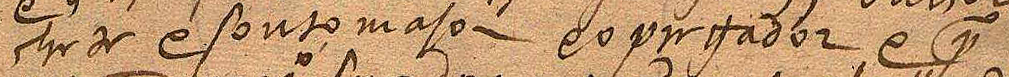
chete e soutomajor e o pregador e p̄o
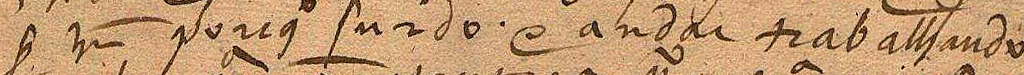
ꞩ hū pouqo surdo. e andar trabalhando
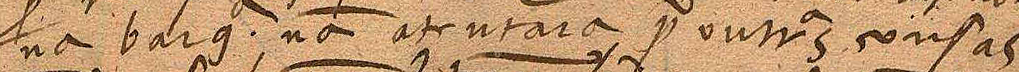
na barqa. nā atentara p̄o outras cousas
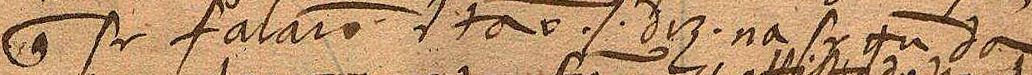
q̄ se falar̄o ētão ./. diz. na segūda
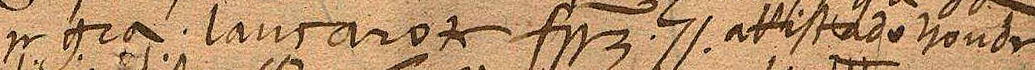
regra. lançarote frr̄z .//. aRiscado honde
